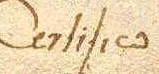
Certifico
